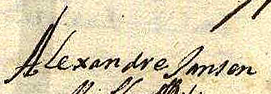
Alexandre Iansen
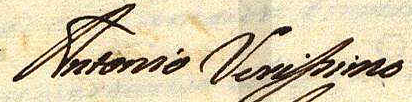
Antonio Verissimo
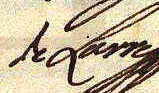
de Larre
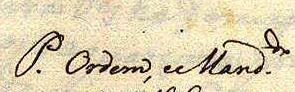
P. Ordem, e Mand.do
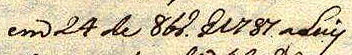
em 24 de 8br.o d̄ 1787 a Luis
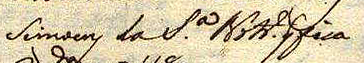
Simoens da S.a Notr.o q̄ fica
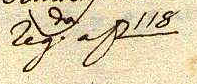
Reg.da a f 118
